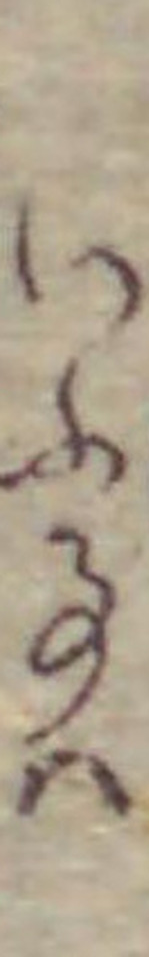いふ事は
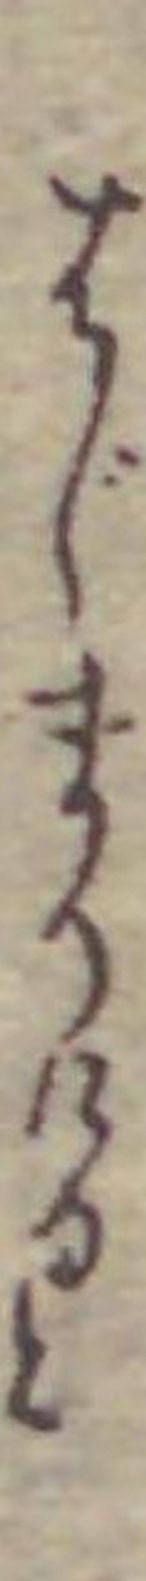はじまりけると
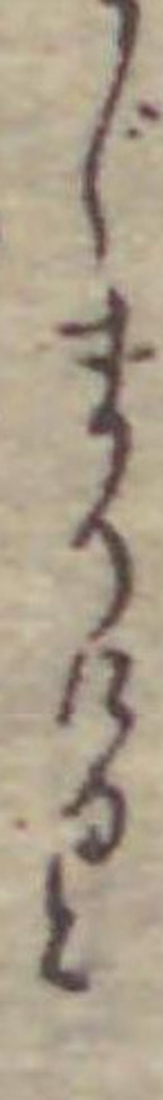はじまりけると
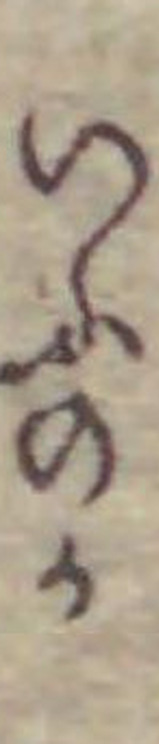いふのか
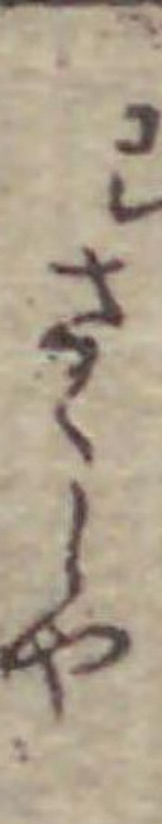コレさくしや
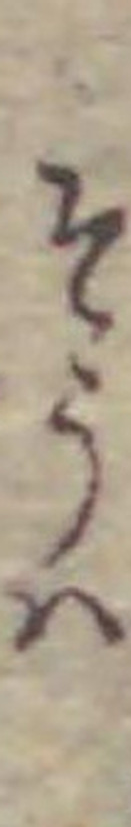そうは
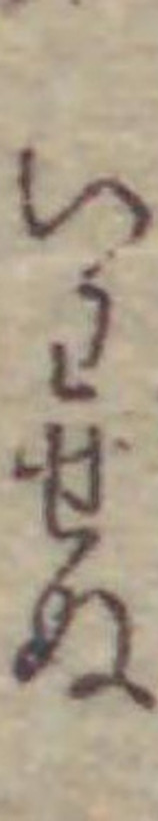いわせぬ

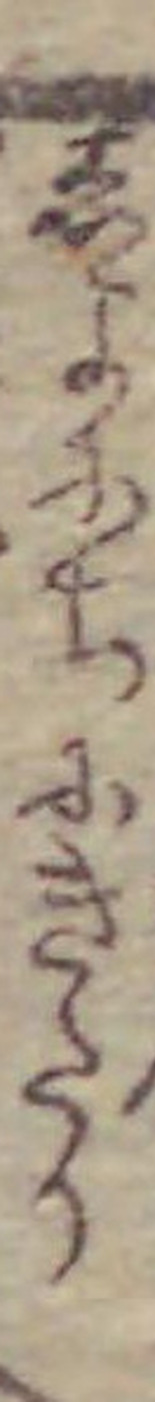しよにちにきたり
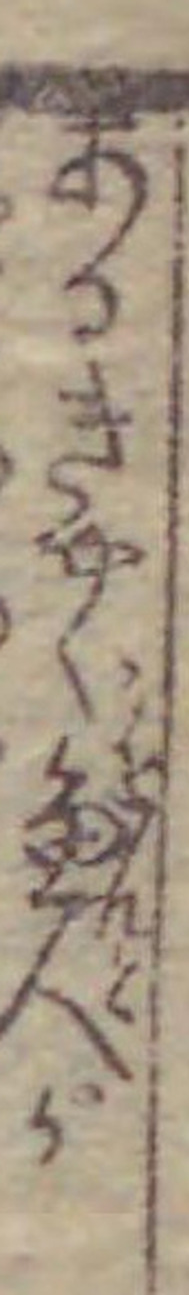あるきやく魚人が
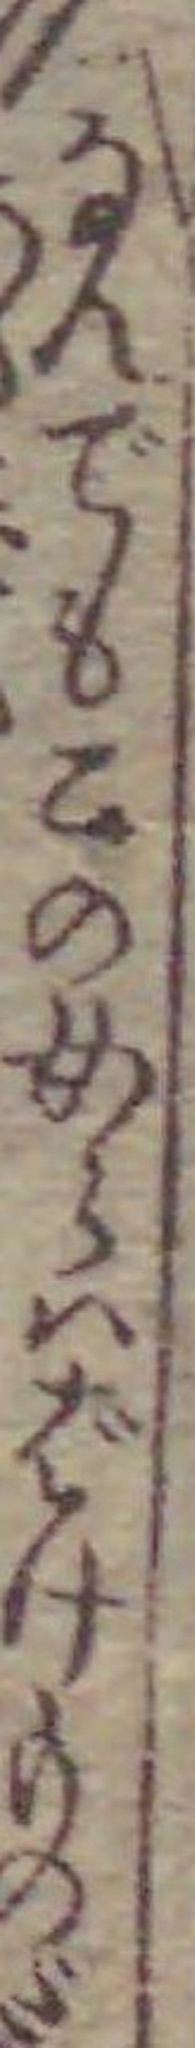〽なんでもこの女郎はばけものだ
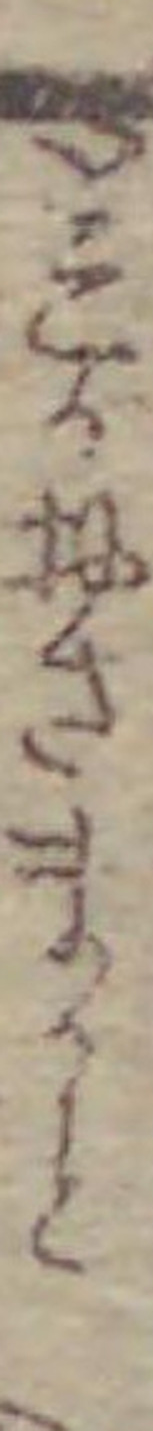とこがおさまると
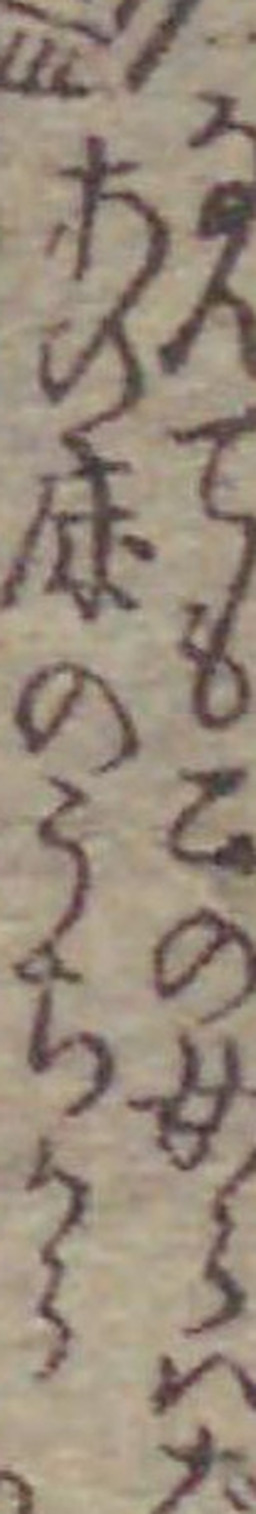あの床のうちから
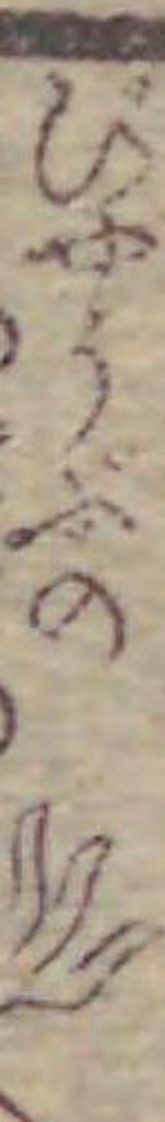びやうぶの
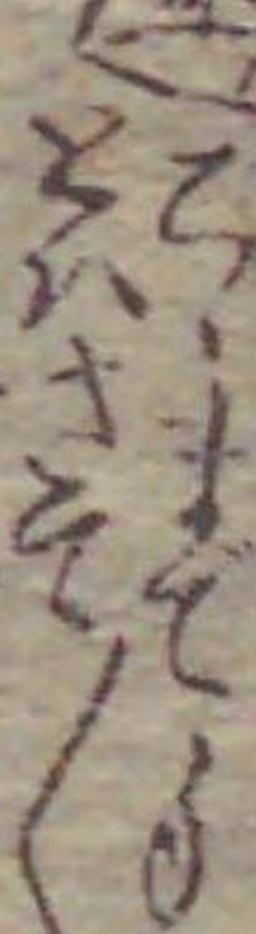とはさて〳〵
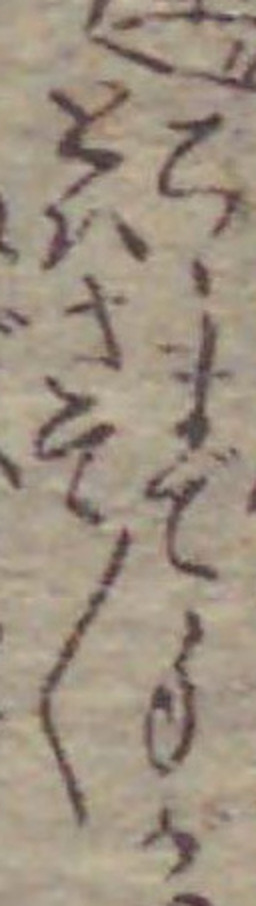とはさて〳〵
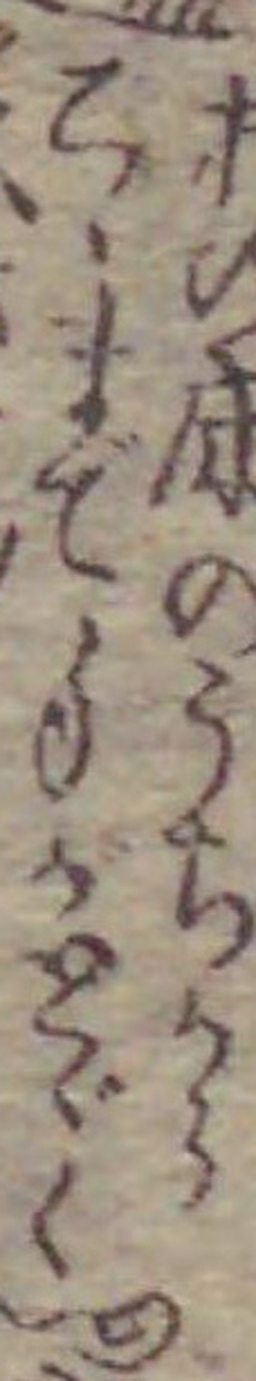こゝまで手がとゞく
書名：箱入娘面屋人魚 3巻
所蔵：国立国会図書館 National Diet Library, JAPAN
